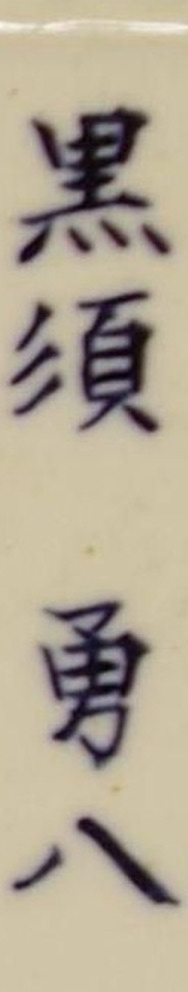黒須勇八
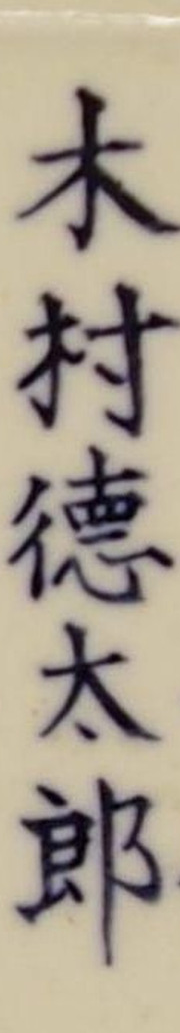木村徳太郎
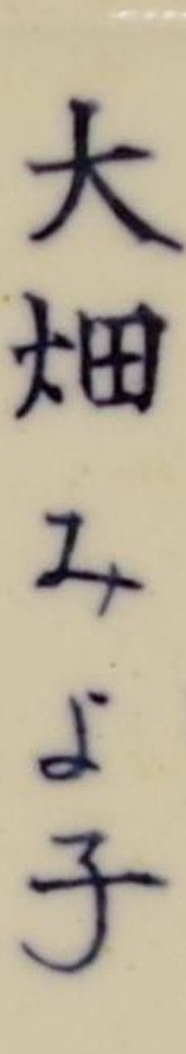大畑みよ子
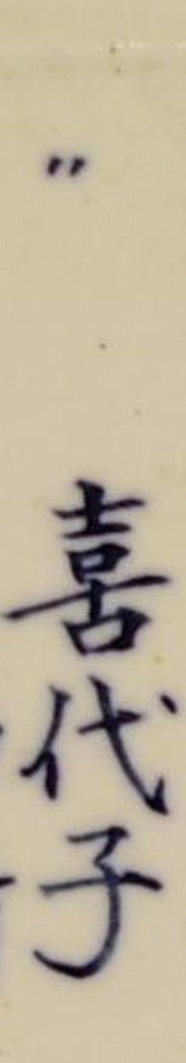喜代子
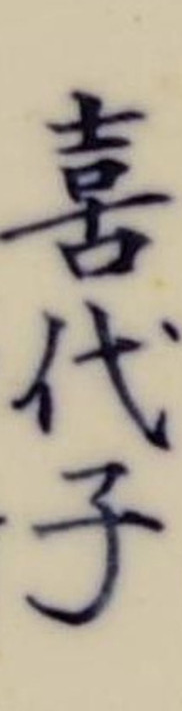喜代子
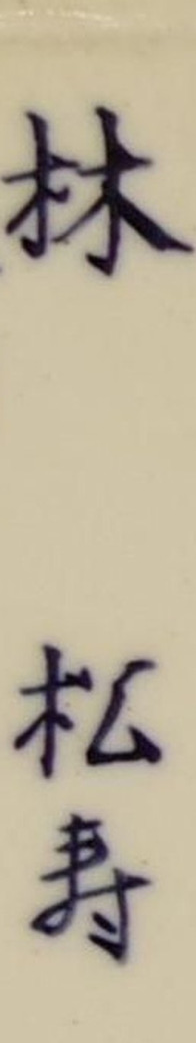林松寿
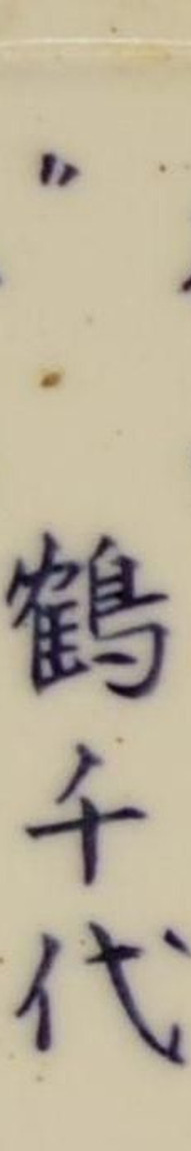鶴千代
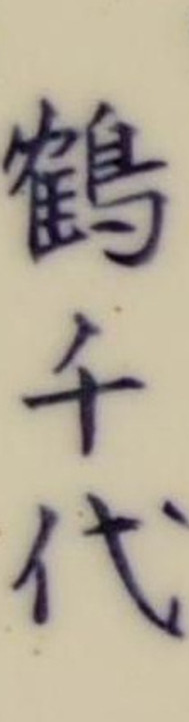鶴千代
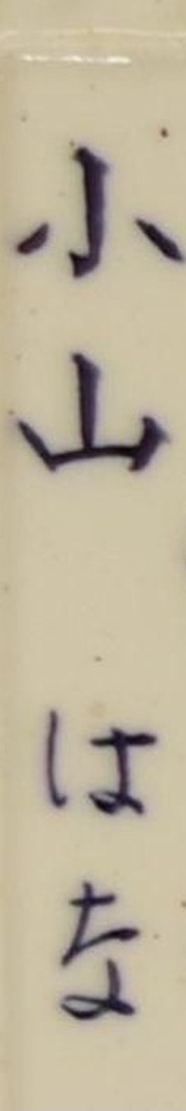小山はな

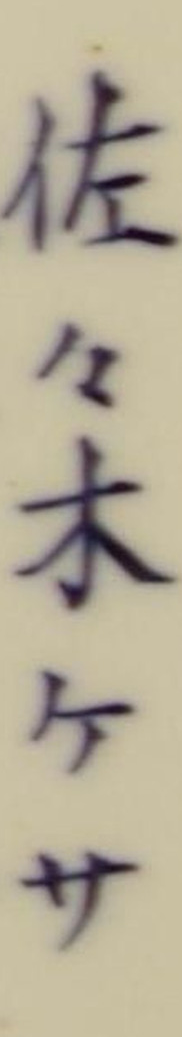佐々木ケサ
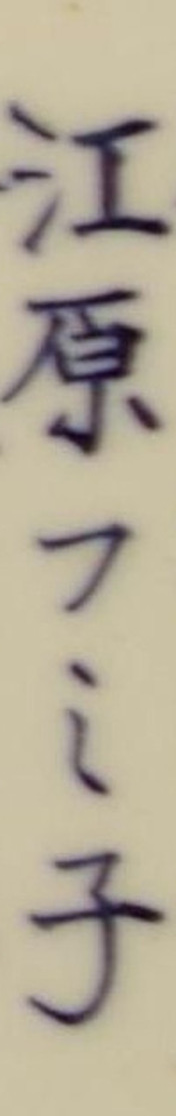江原フミ子
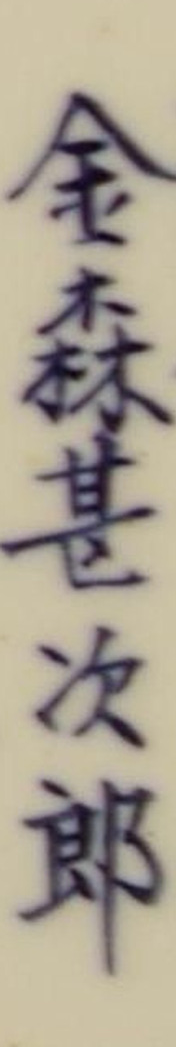金森甚次郎
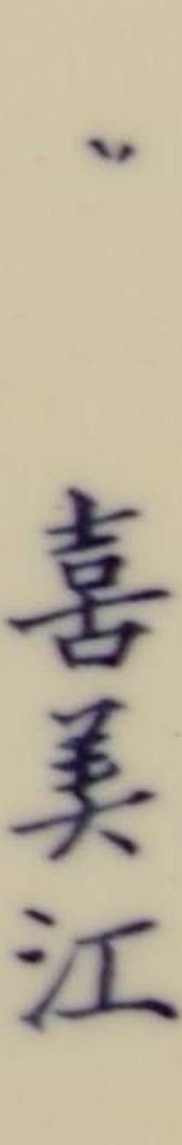喜美江
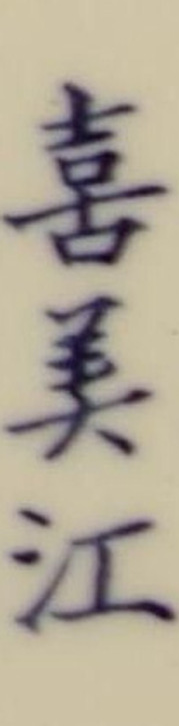喜美江
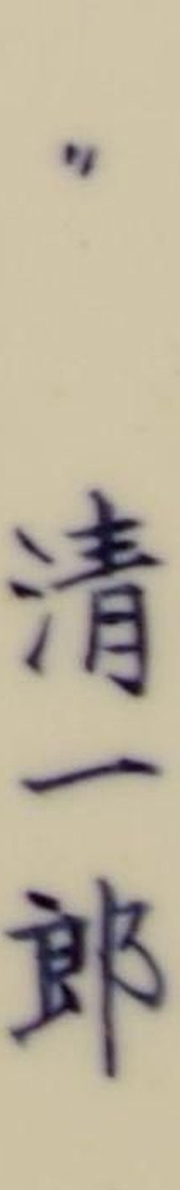清一郎
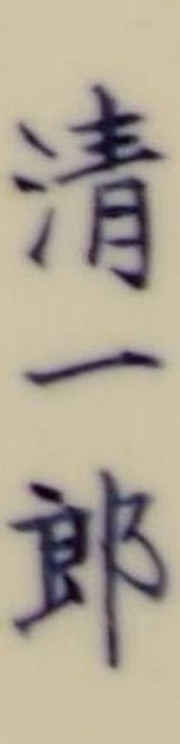清一郎
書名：E~L
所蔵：高野山金剛峯寺
